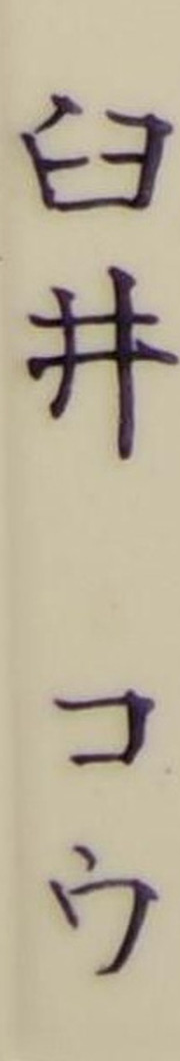臼井コウ

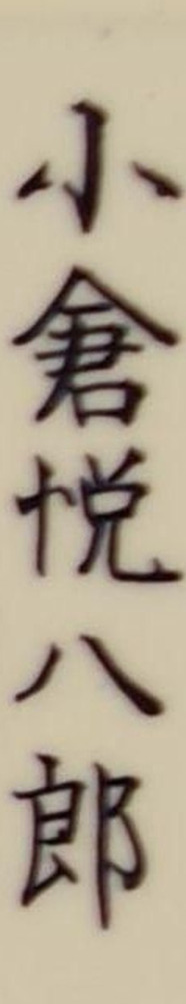小倉悦八郎
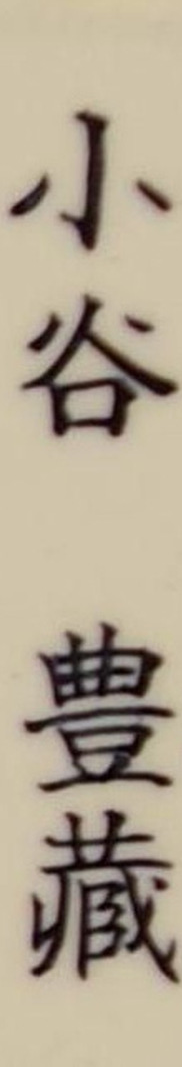小谷豊蔵
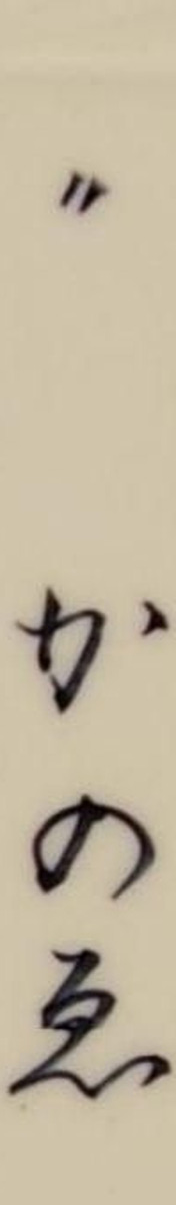かのえ
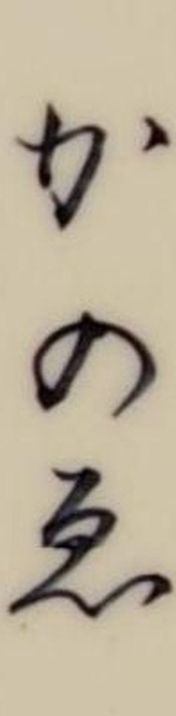かのえ
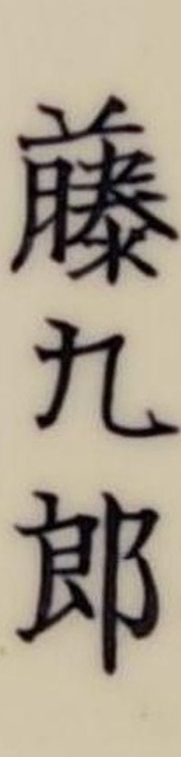藤九郎
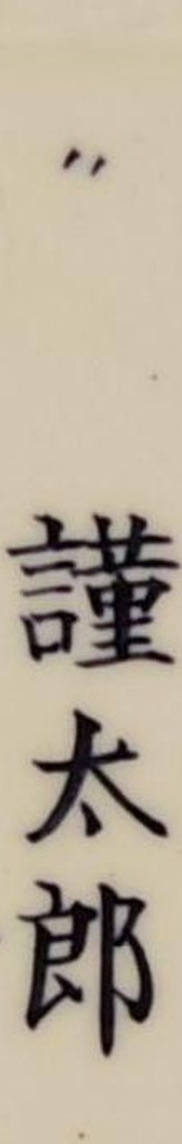謹太郎
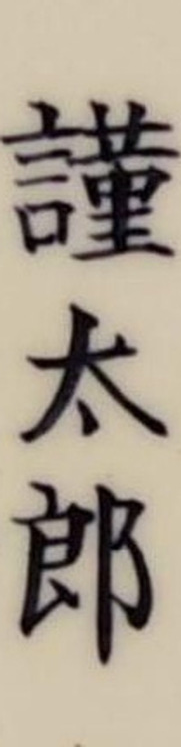謹太郎
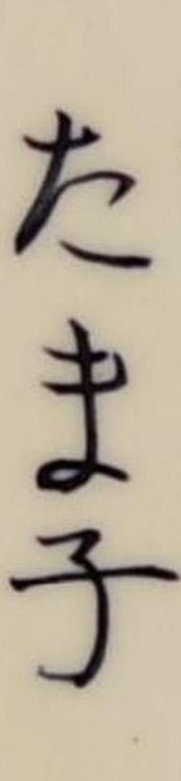たま子
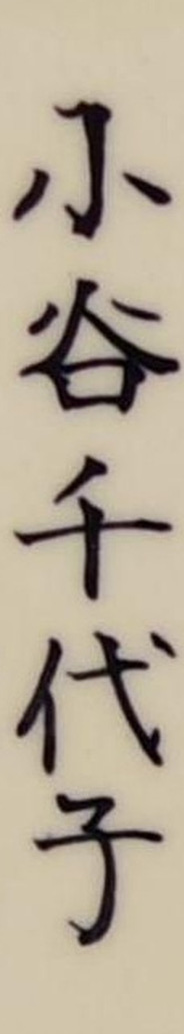小谷千代子
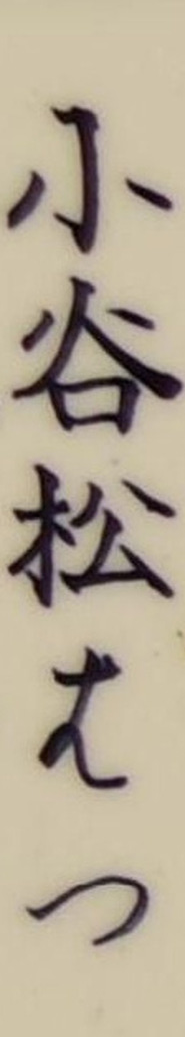小谷松はつ
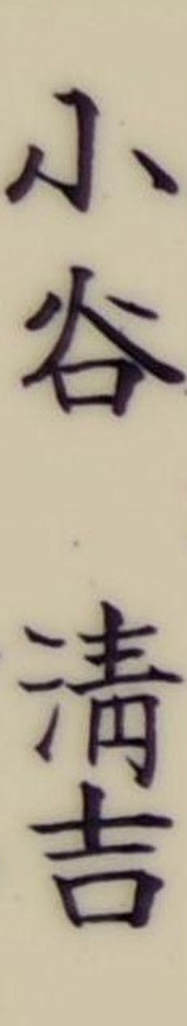小谷清吉
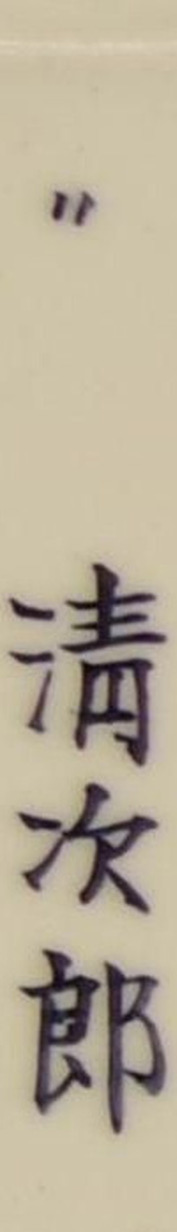清次郎
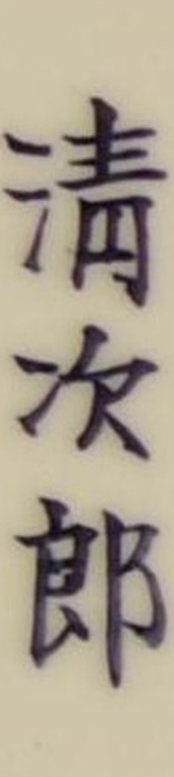清次郎
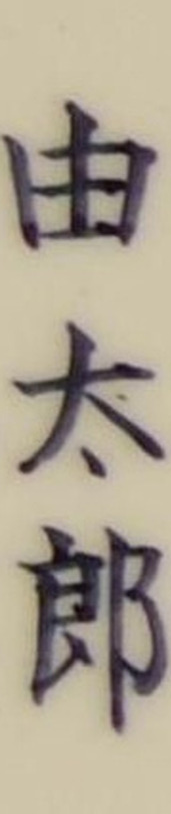由太郎

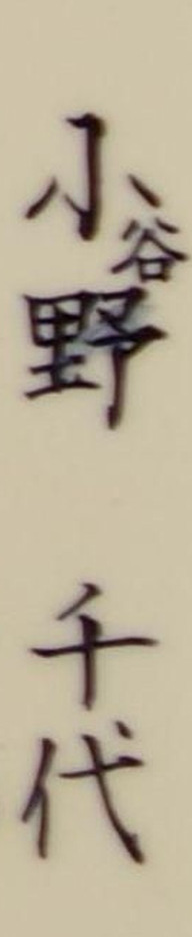小谷野千代
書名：E~L
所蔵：高野山金剛峯寺
